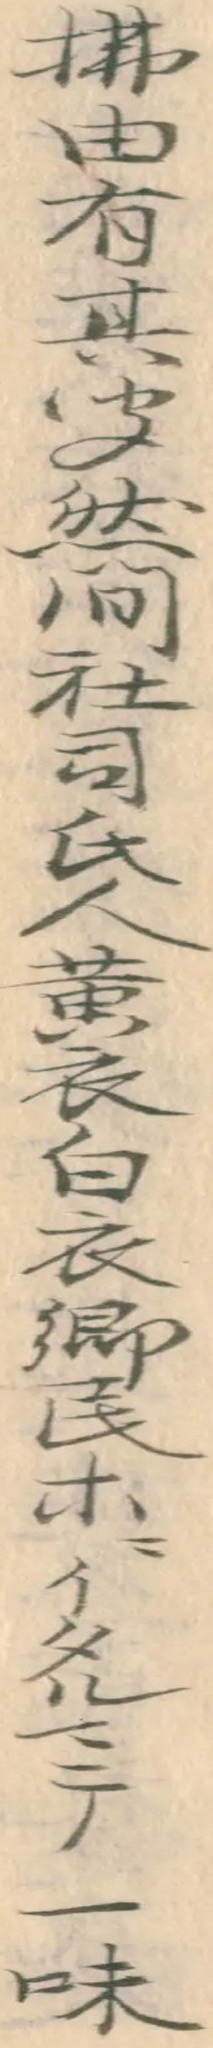払由有其聞然間社司氏人黄衣白衣郷民等ニイタルマテ一味
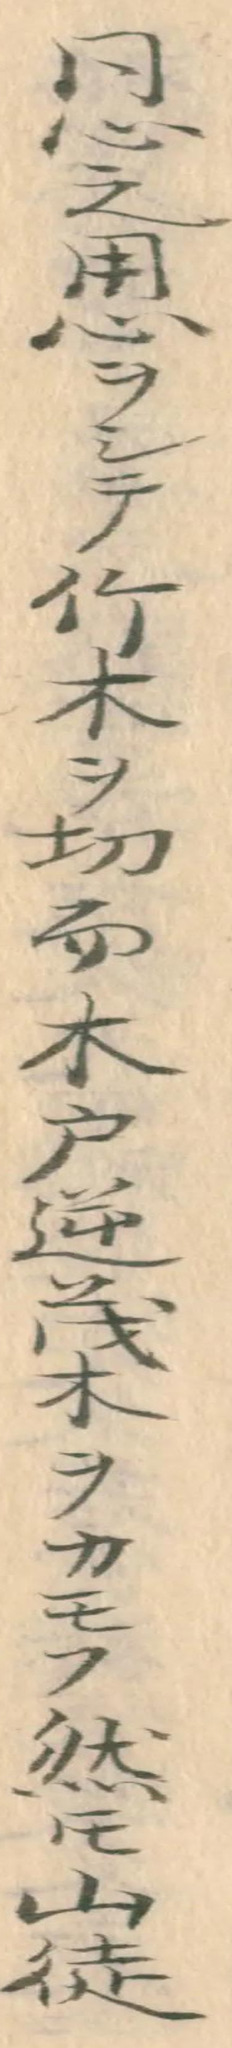同心之用心ヲシテ竹木ヲ切而木戸逆茂木ヲカモフ然トモ山徒
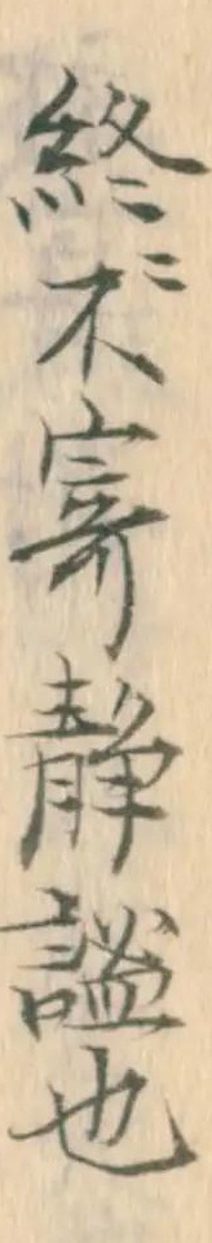終ニ不寄静謐也
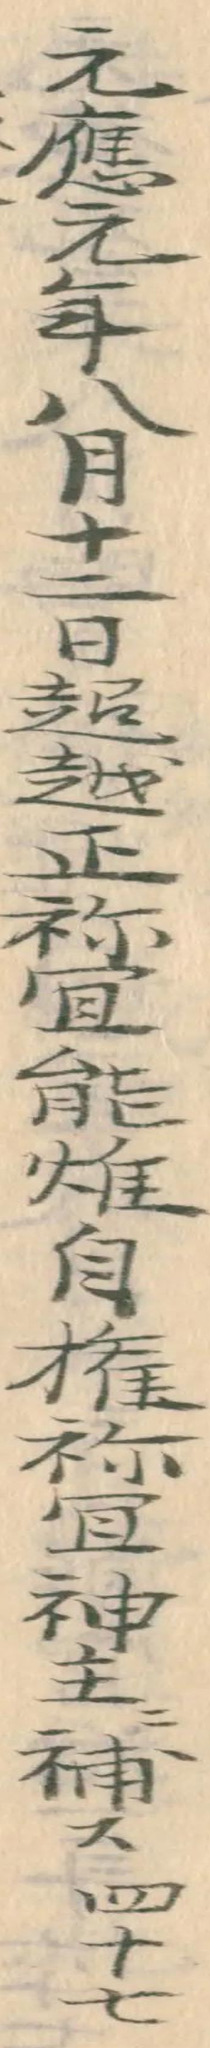元応元年八月十二日超越正祢宜能惟自権祢宜神主ニ補ス四十七
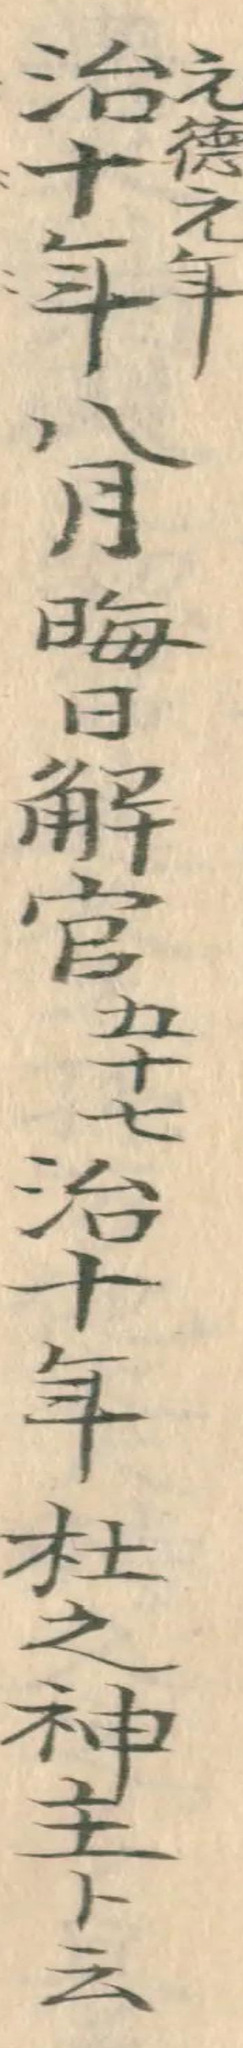治十年八月晦日解官五十七治十年杜之神主ト云
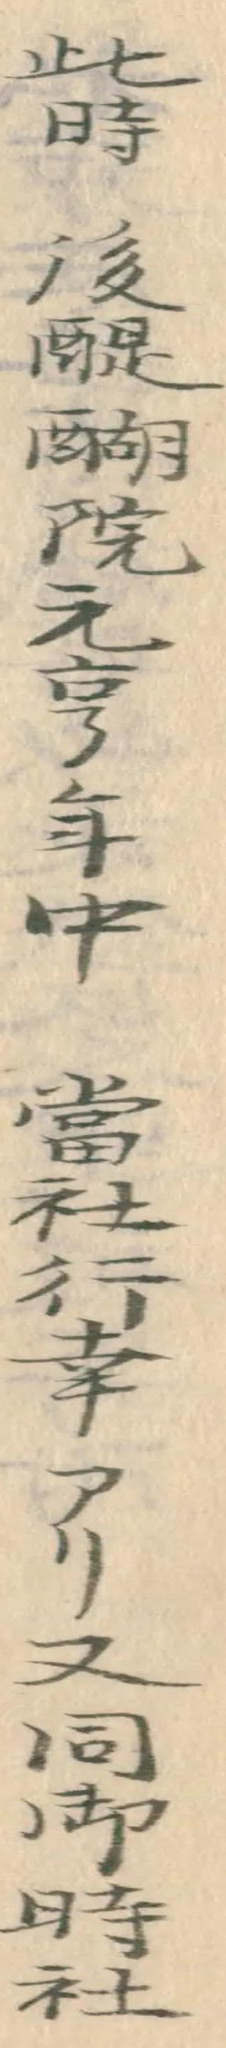此時後醍醐院元亨年中当社行幸アリ又同御時社
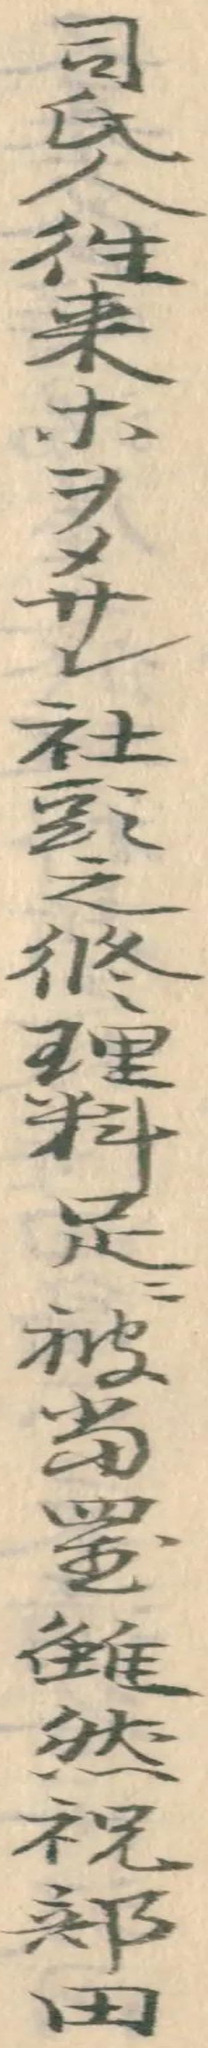司氏人往来等ヲメサレ社頭之修理料足ニ被当置雖然祝部田
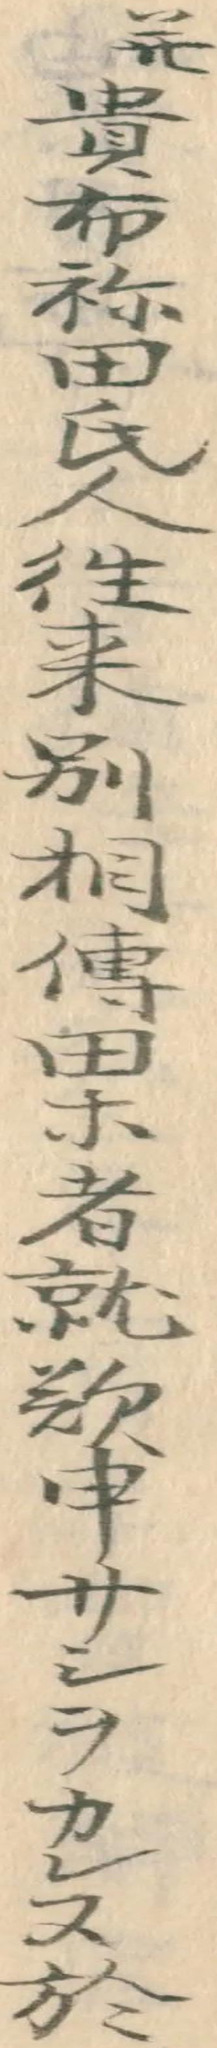并貴布祢田氏人往来別相伝田等者就歎申サシヲカレヌ於
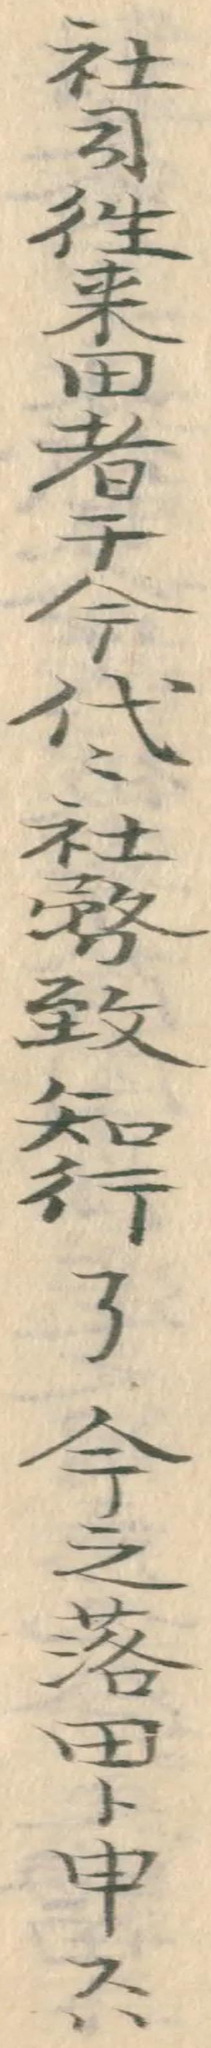社司往来田者于今代々社務致知行了今之落田ト申スハ
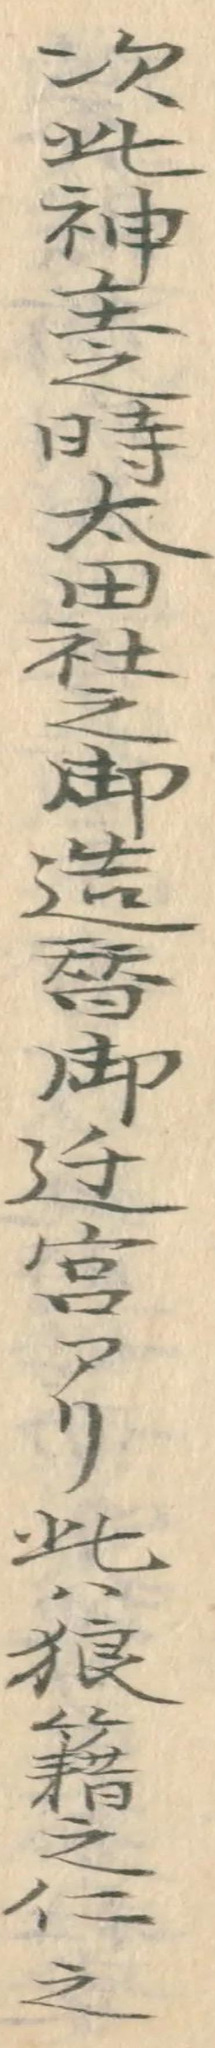次此神主之時太田社之御造替御遷宮アリ此ハ狼藉之仁之
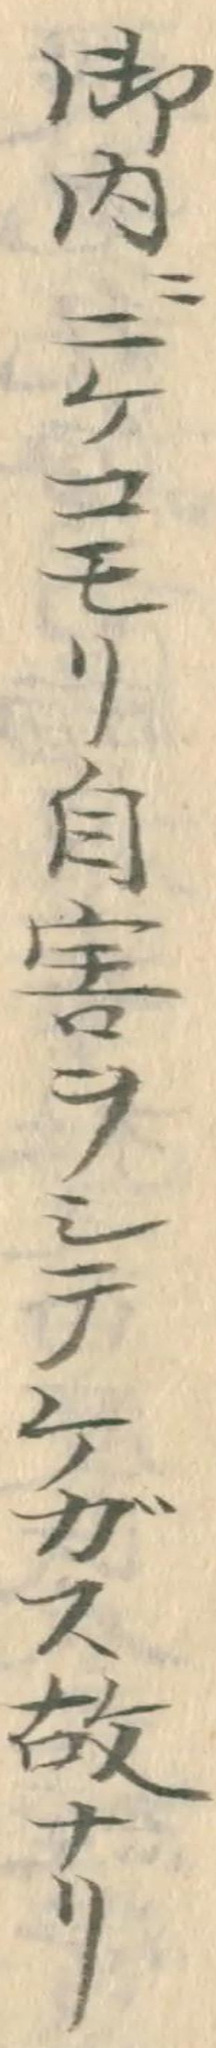御内ニニケコモリ自害ヲシテケガス故ナリ
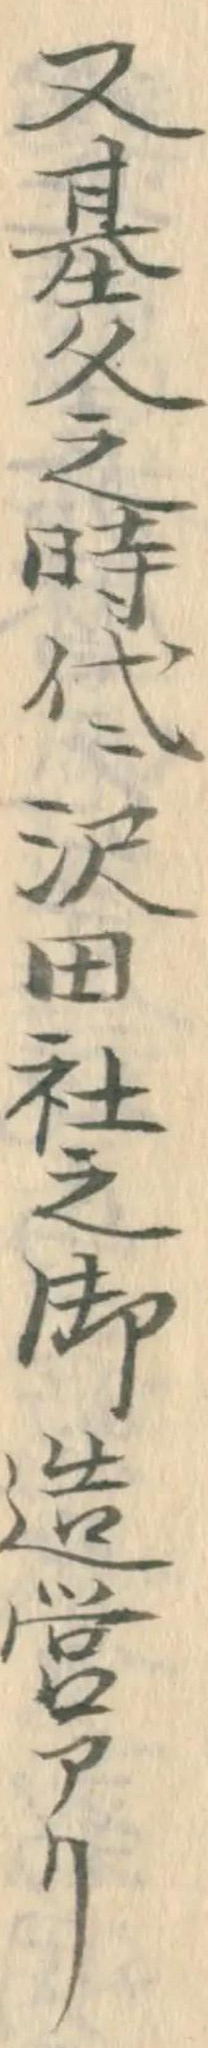又基久之時代ニ沢田社之御造営アリ

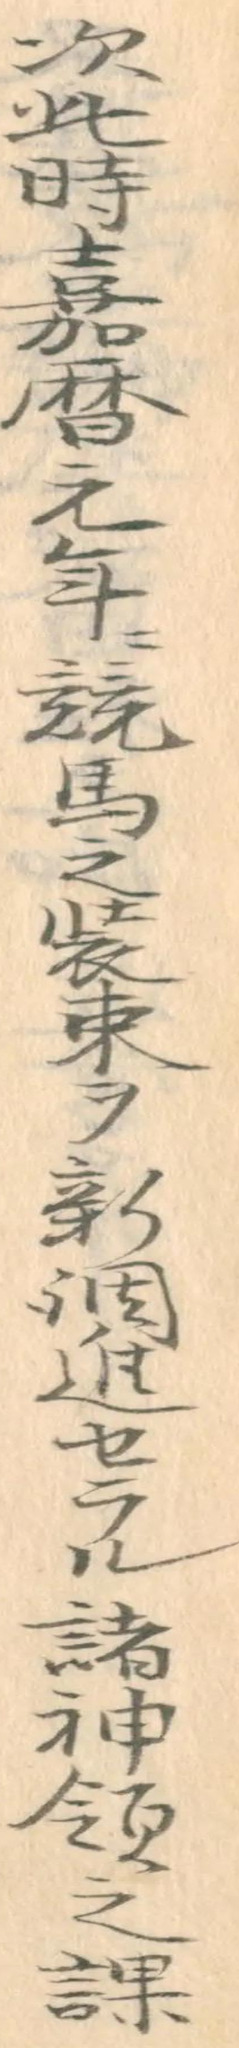次此時嘉暦元年ニ競馬之装束ヲ新調進セラル諸神領之課
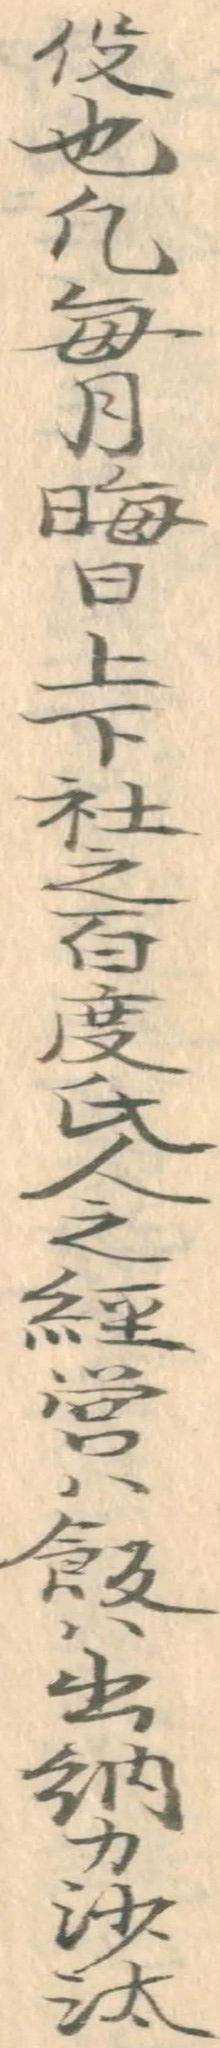役也凡毎月晦日上下社之百度氏人之経営ハ飯ハ出納カ沙汰
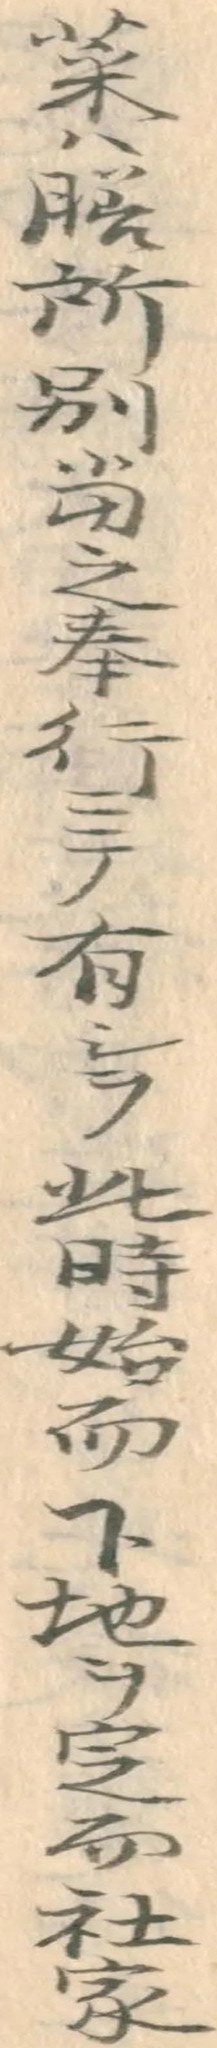菜ハ膳所別当之奉行ニテ有シヲ此時始而下地ヲ定而社家
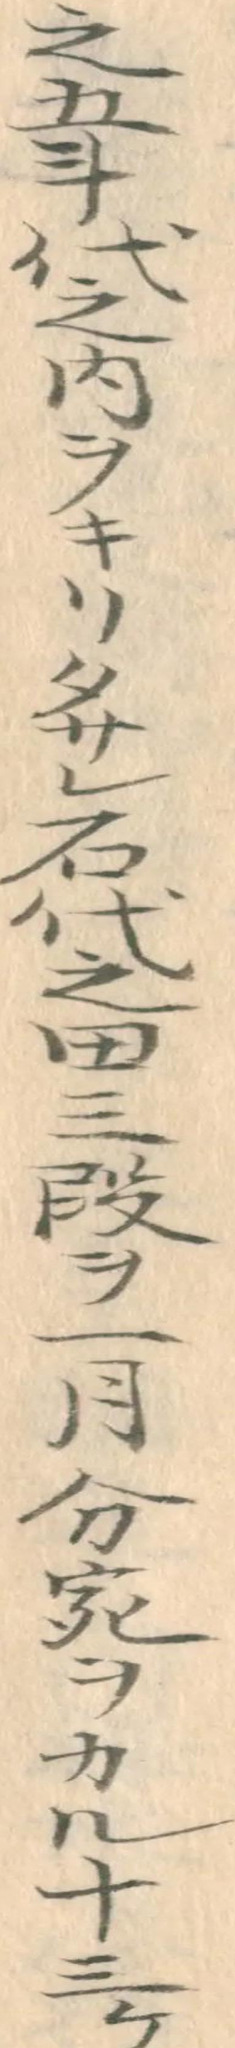之五斗代之内ヲキリタサレ石代之田三段ヲ一月分宛ヲカル十三ケ
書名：賀茂社記録. 第24冊
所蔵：国立国会図書館 National Diet Library, JAPAN
